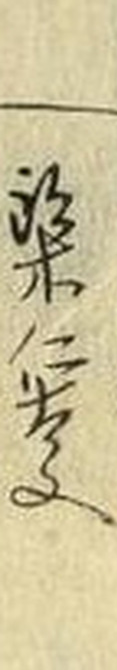鈴木仁太夫
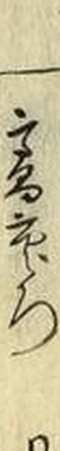高畠市郎右衛門
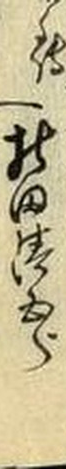村田清五郎
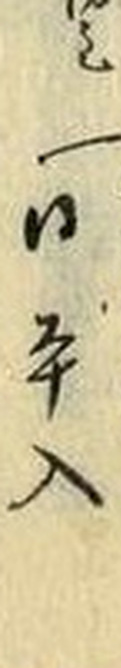同平八
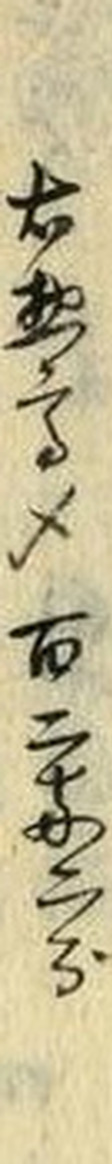右惣高〆百二両二分
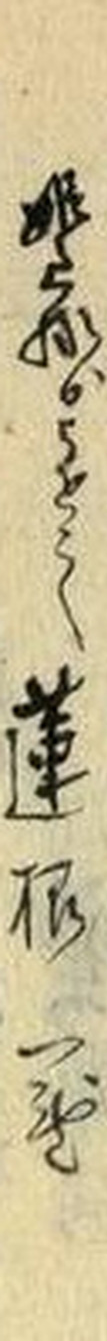姫君様ゟ被進之蓮根一台
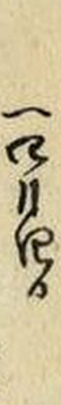一四月四日
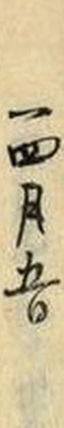一四月四日
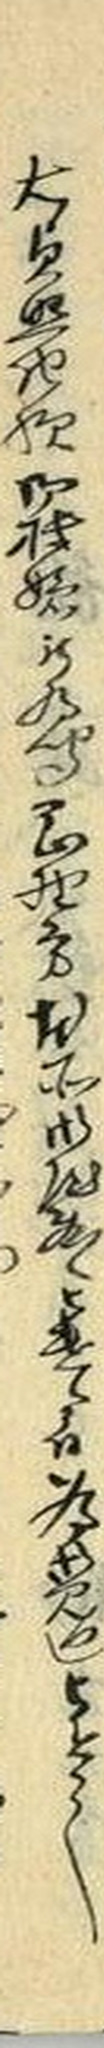右貞照院様御機嫌被為聞岡野方本所御屋敷へ被遣候ニ付為御見廻被進之
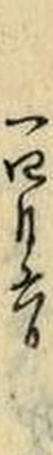一四月四日
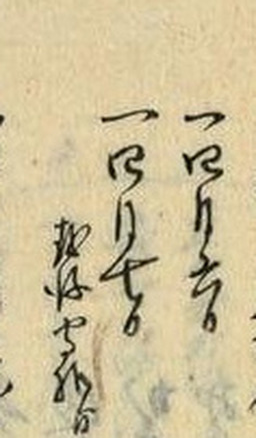一四月四日
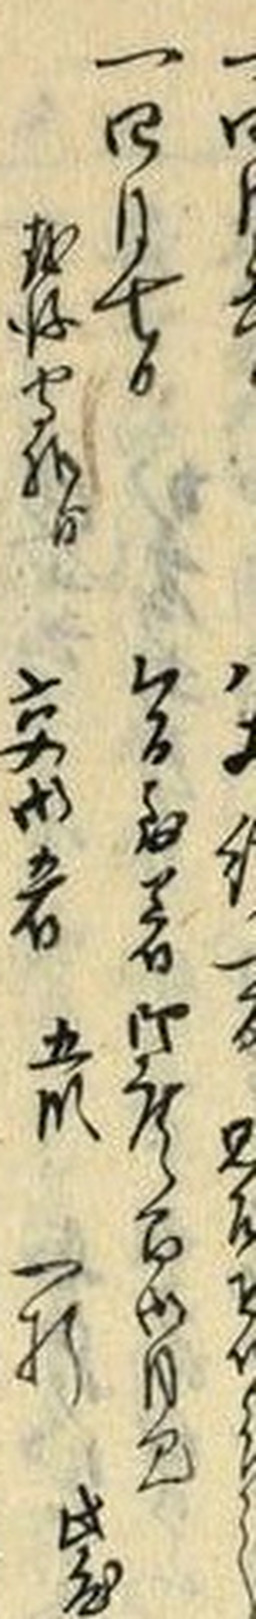越後守様ゟ交御肴五段一折
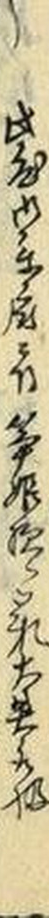此度御参府ニ付箏姫様へ御礼大奥取扱被進之
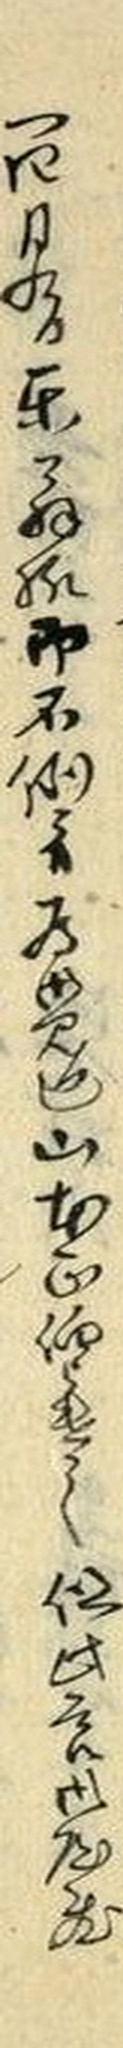一四月九日楽翁様御不例ニ付為御見廻山本正伯被遣之但此節御屋敷
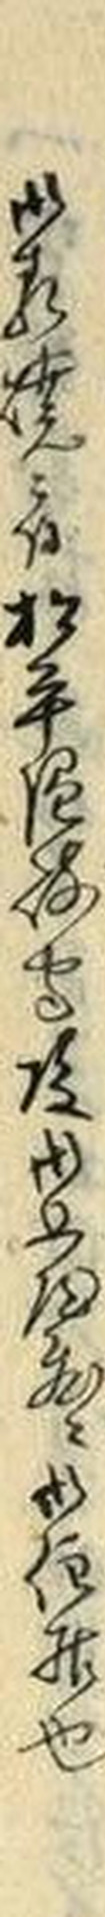御類焼ニ付松平隠岐守殿御上屋敷ニ御住居也
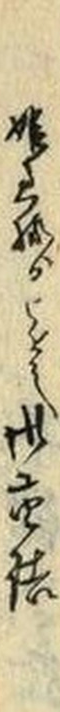姫君様ゟ被進之御重詰
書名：少傅日録抄（斉承付側向頭取日記、在府）
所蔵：福井県文書館 Fukui Prefectural Archives
